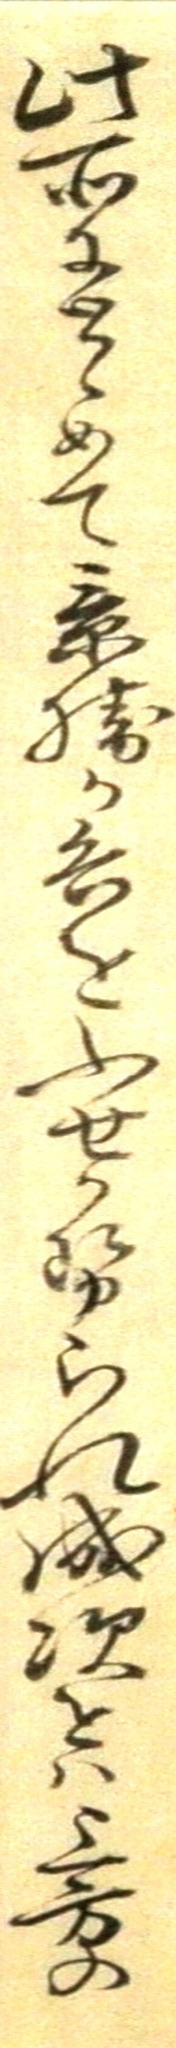此所にとゝめて景勝か兵をふせかせられ成次をは上方の
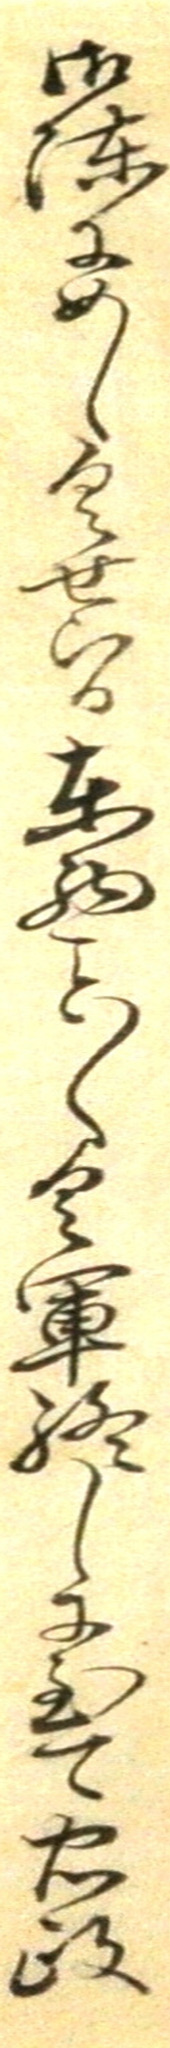御陣にめし具せらる東西こと〳〵く軍終しに至て忠政
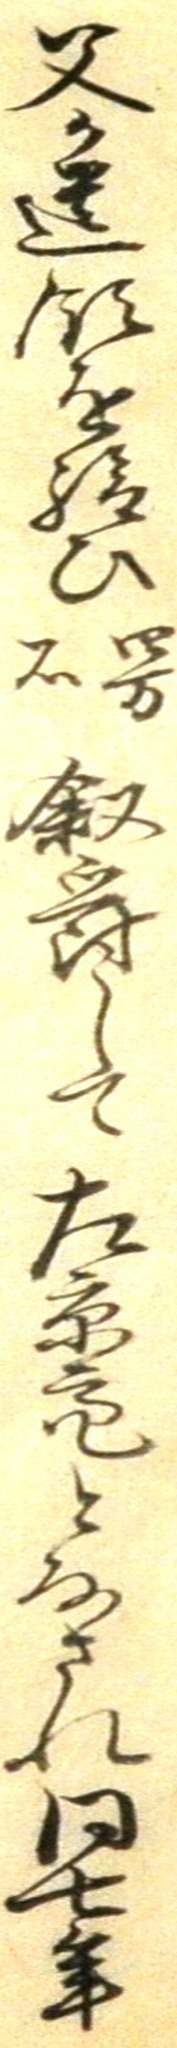父か遺領を給ひ四万石叙爵して左京亮となされ同七年
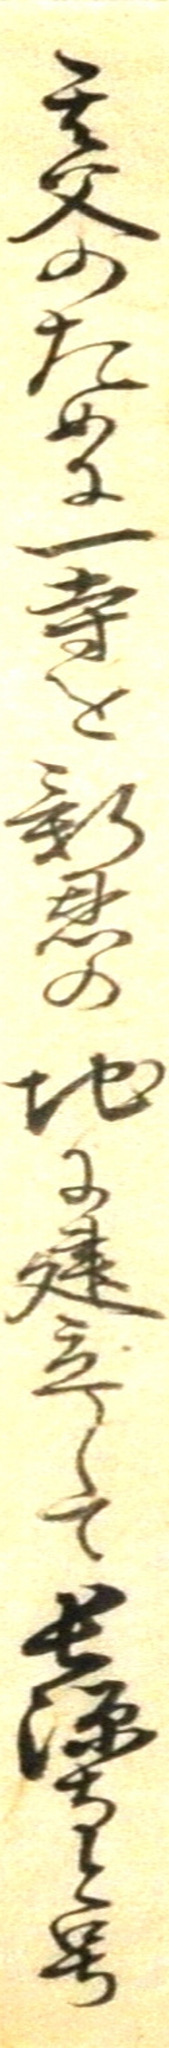其父のために一寺を新恩の地に建立して長源寺と号
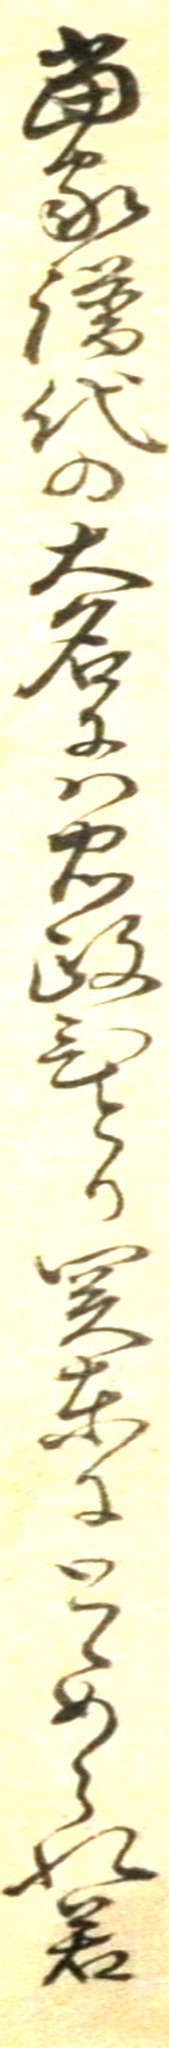当家譜代の大名には忠政ひとり関東にとゝめられ若
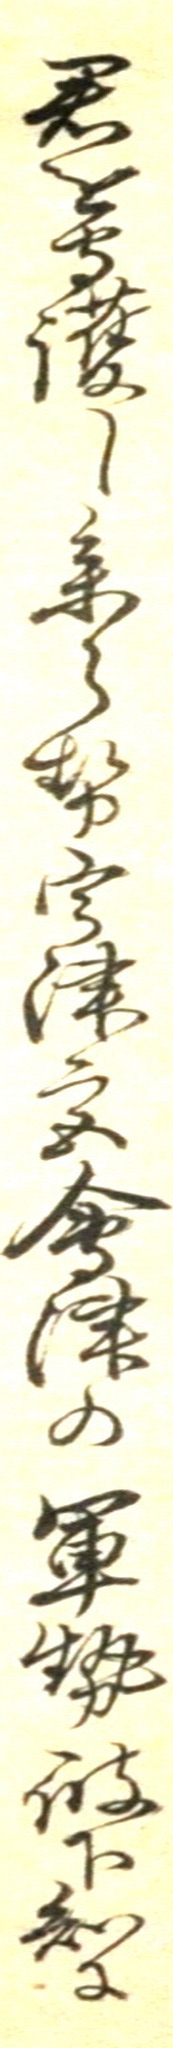君を守護し参らせ宇津宮会津の軍勢彼下知に
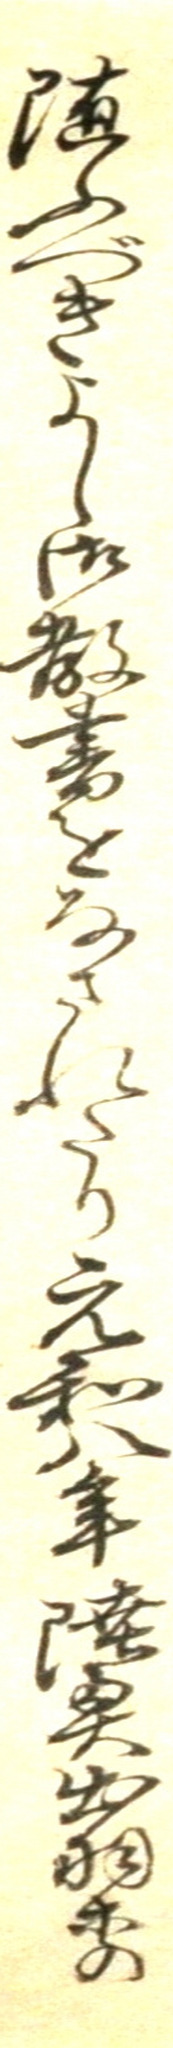随ふべきよし御教書をなされたり元和八年陸奥出羽等の
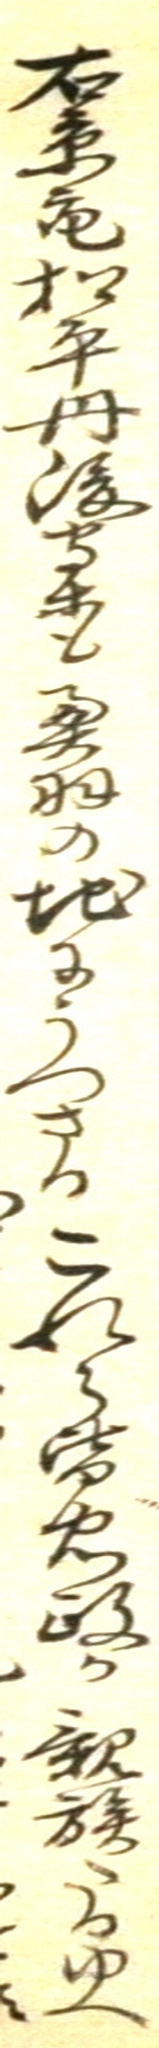右京亮松平丹後守等も奥羽の地にうつさるこれら皆忠政か親族たるゆへ
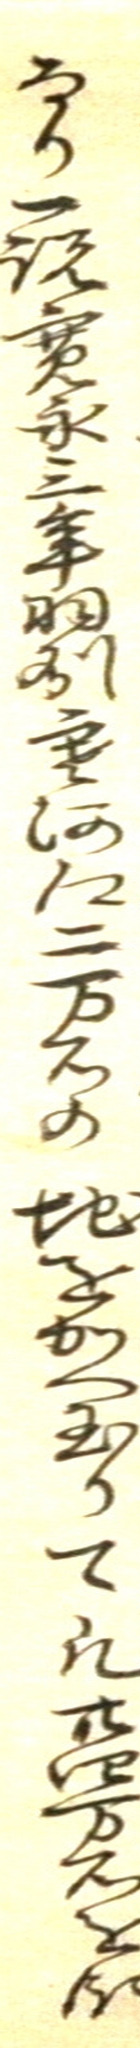なり一説寛永三年羽州寒河郷二万石の地を加へ玉りて凡二十四万石を領
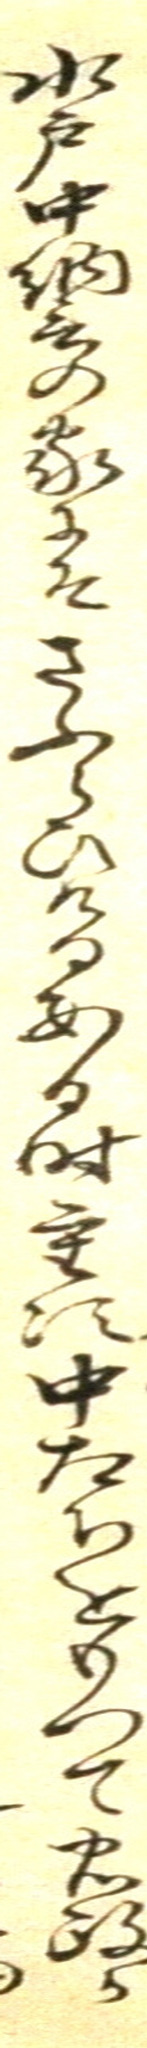水戸中納言の家にそさふらひけるある時重次中たちをもつて忠政か
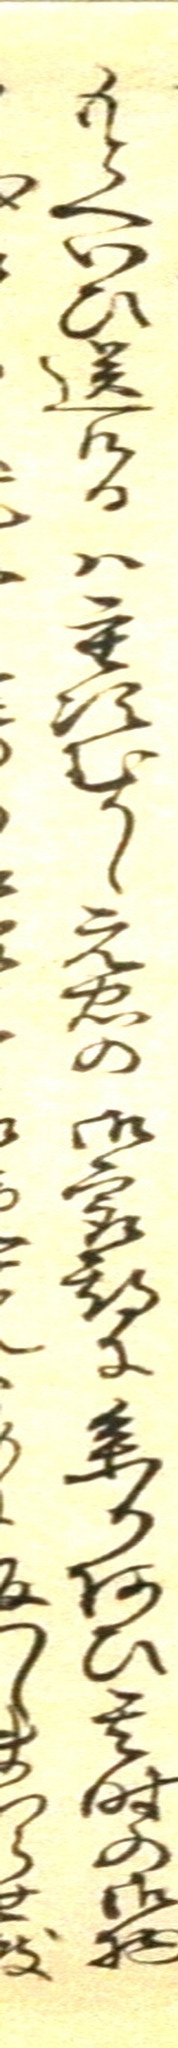もとへいひ送けるは重次むかし元忠の御最期に参りあひ其時の御物
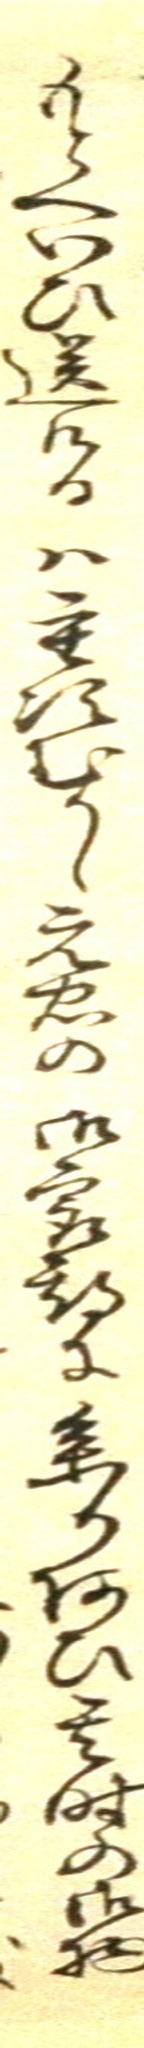もとへいひ送けるは重次むかし元忠の御最期に参りあひ其時の御物
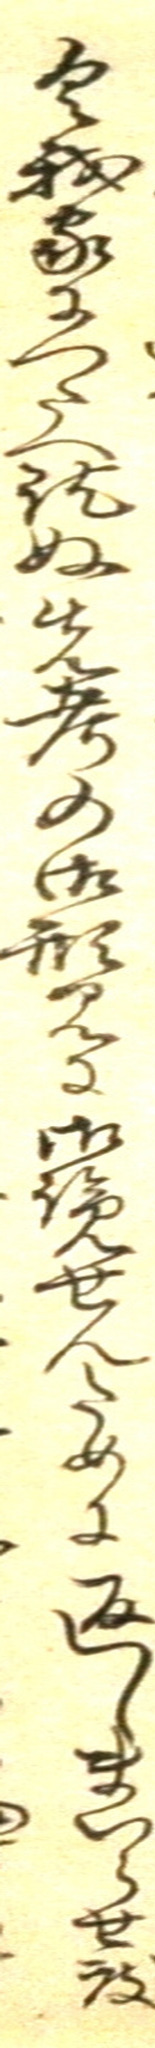具我家につたへ訖ぬ先考の御形見に御覧せんために返しまいらせ度
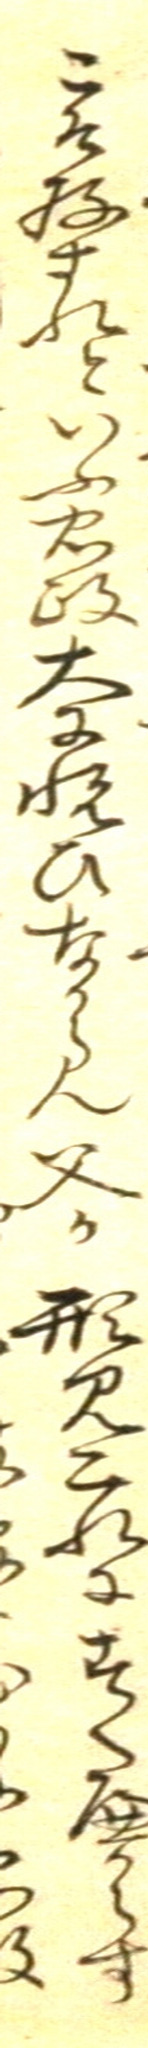こそ存すれといふ忠政大に悦ひなからん父か形見これにすくへからす
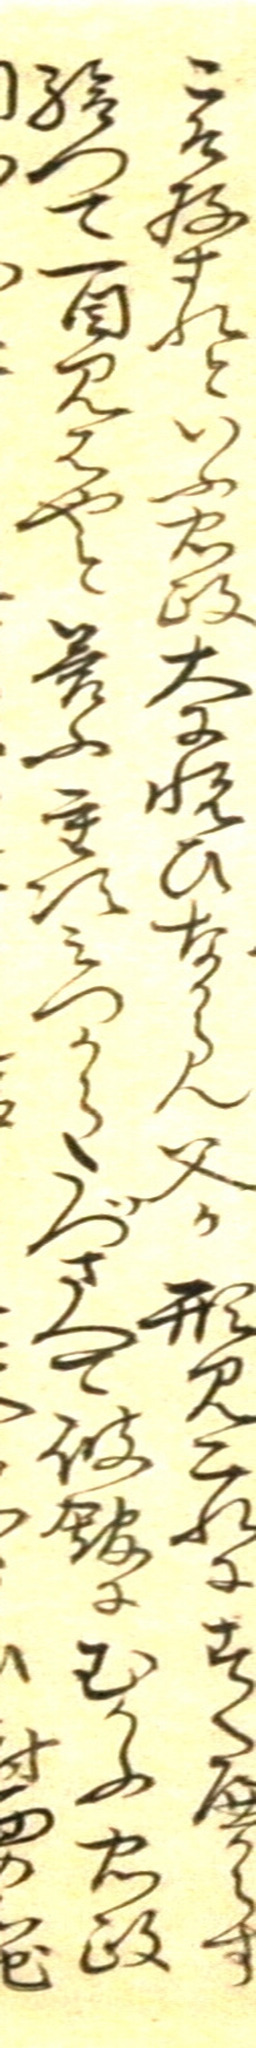給つて一目見はやと答ふ重次みつからたづさへて彼舘にむかふ忠政
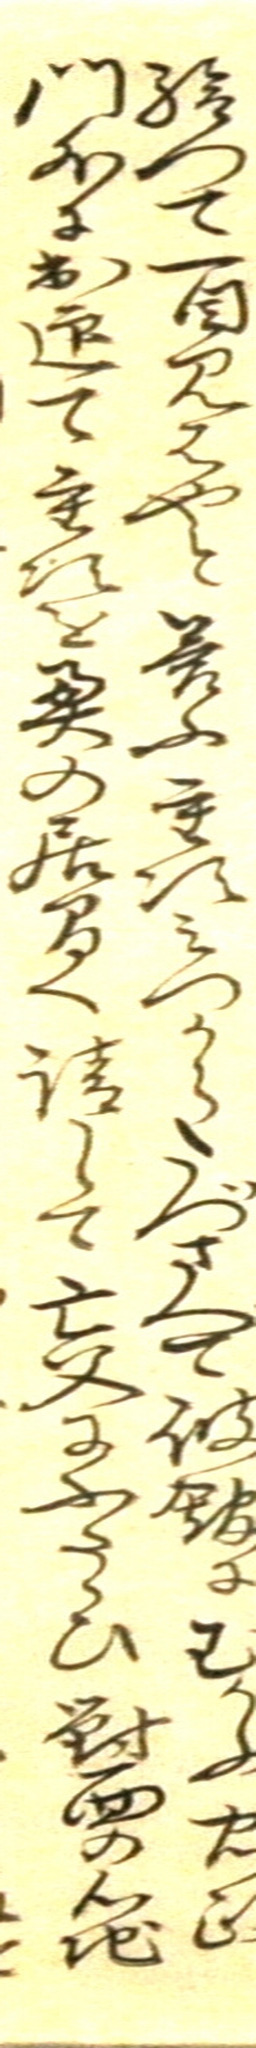門外に出迎て重次を奥の居間へ請して亡父にふたゝひ対面の心地
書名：藩翰譜（四・中）
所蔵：伊那市立高遠町図書館・合同会社AMANE
